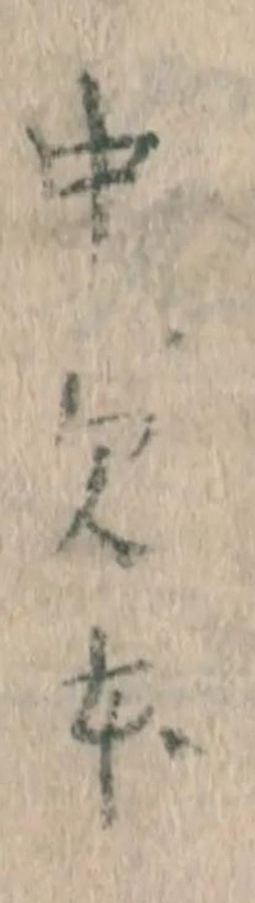中欠本

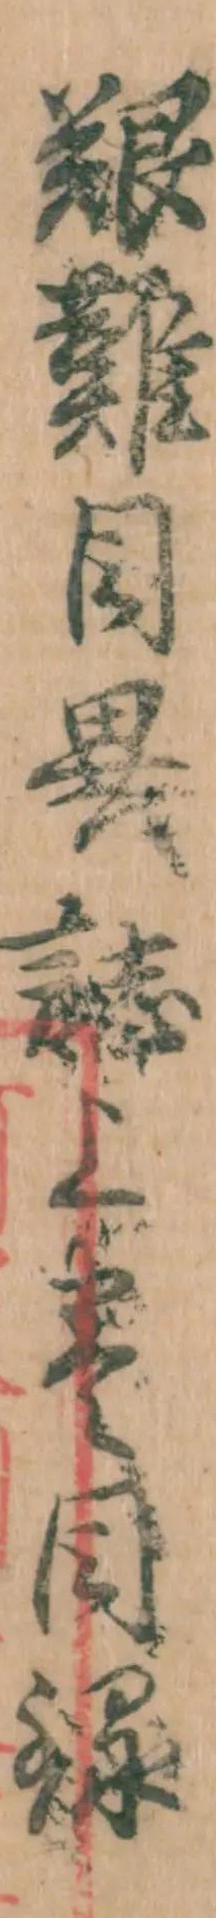艱難目異誌上書目録
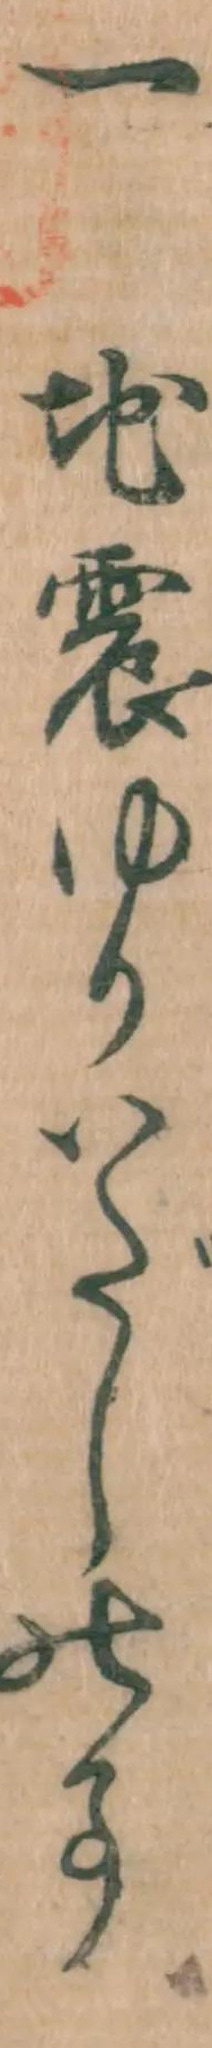一地震ゆりいだしの事
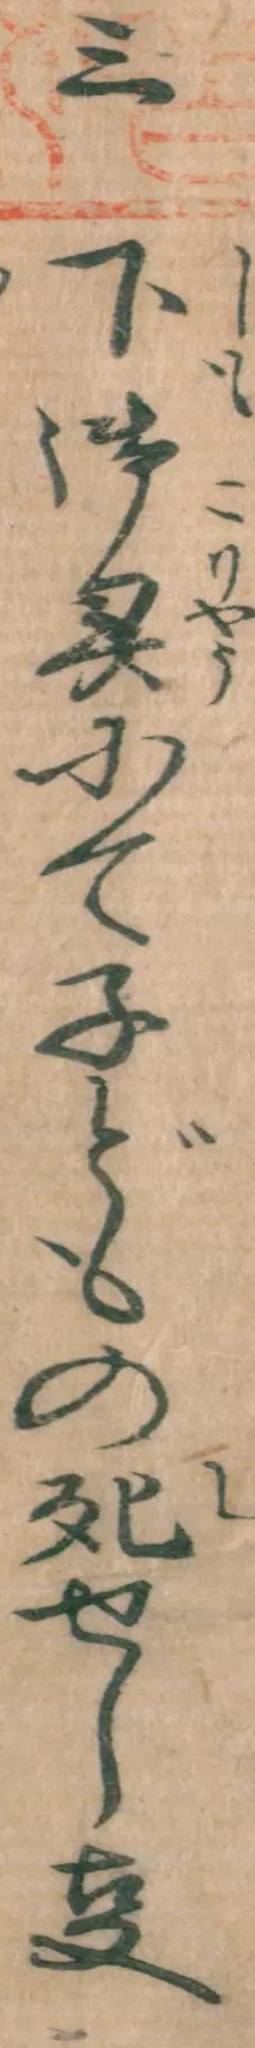三下御灵にて子どもの死せし事
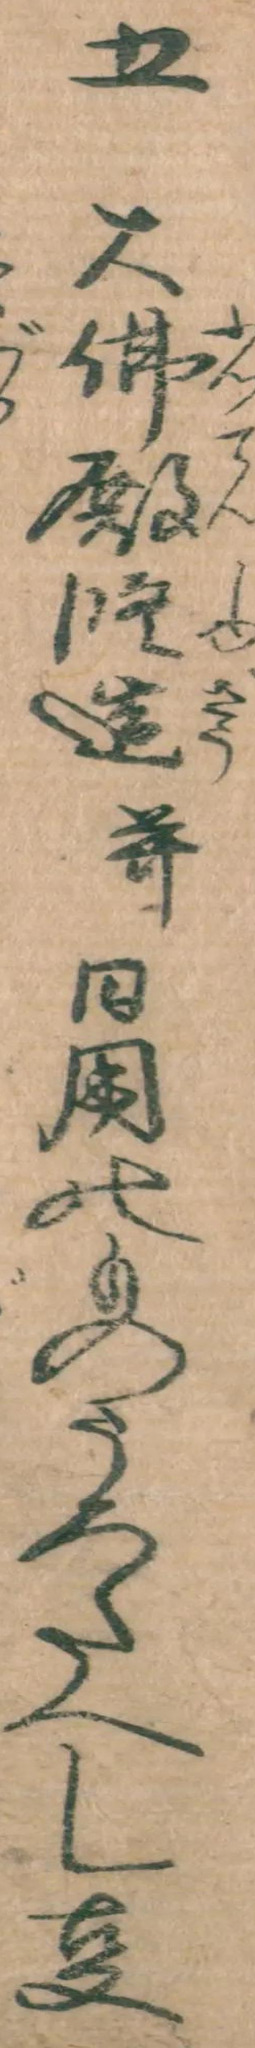五大佛殿修造并日用のものうろたへし事
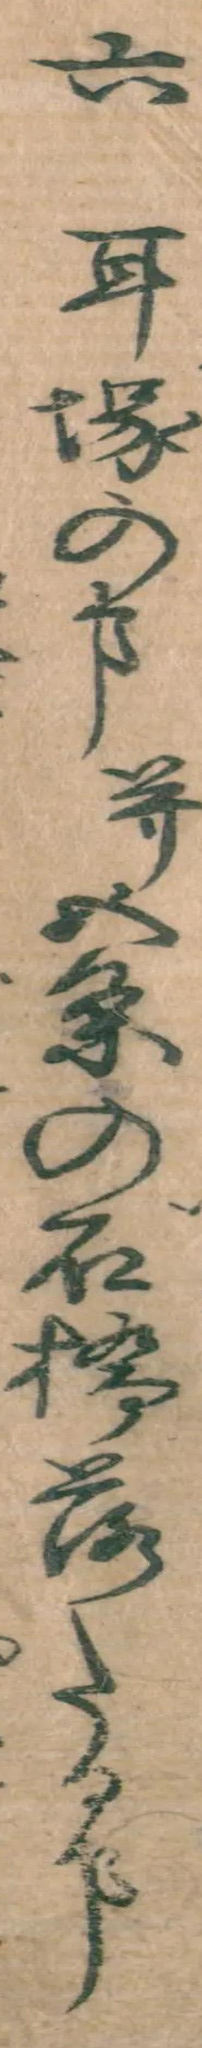六耳塚の事并五条の石橋落たる事
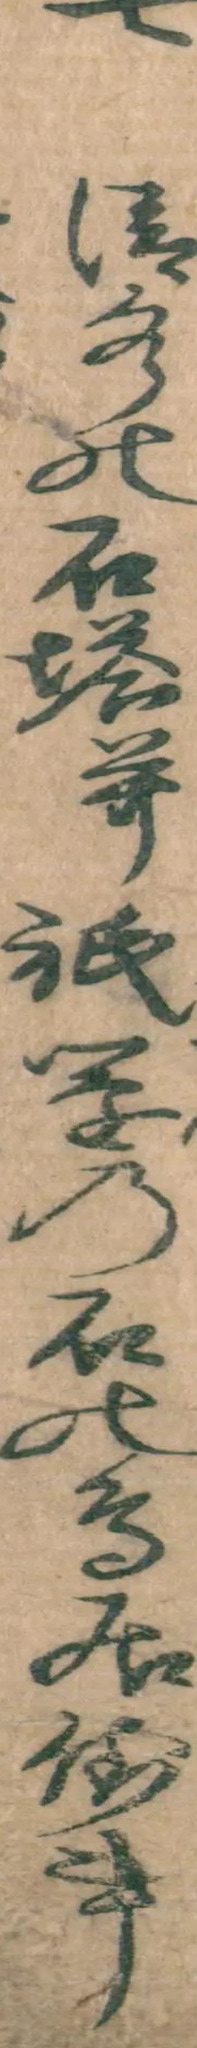七清水の石塔并祇園の石の鳥居倒事
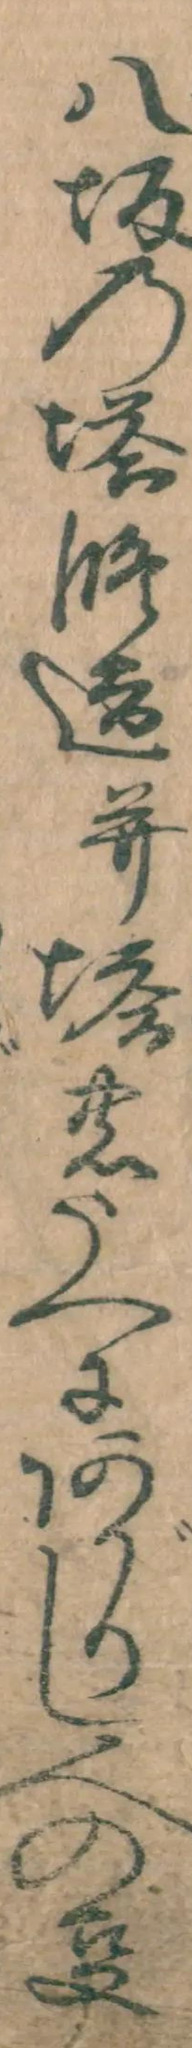八八坂の塔修造并塔のうへにあがりし人の事
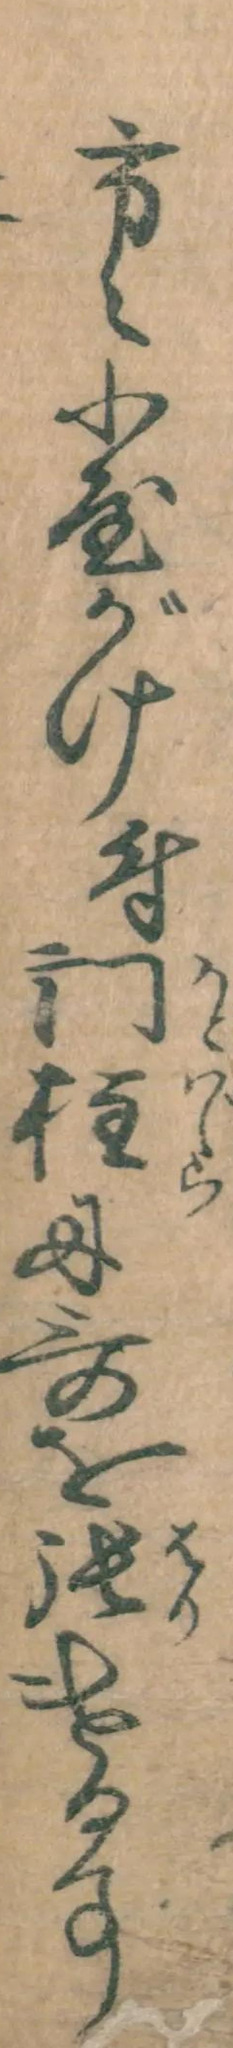九方々小屋がけ付門柱に哥を張ける事

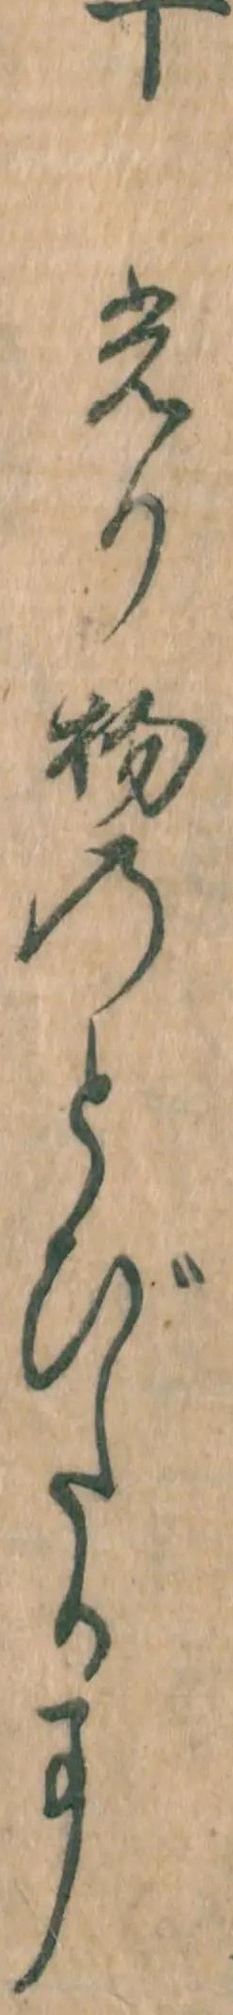十光り物のとびたる事
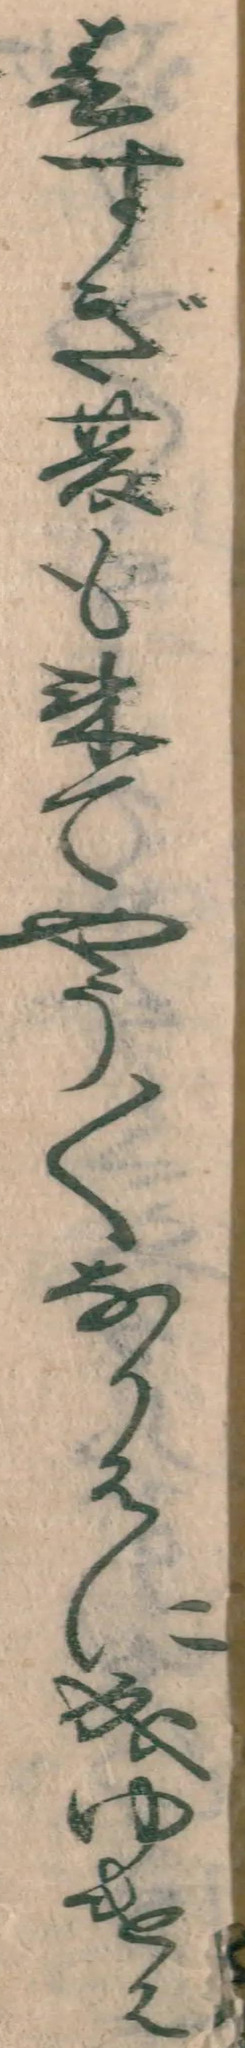春すぎ夏も来てやう〳〵なかはに成ゆけは
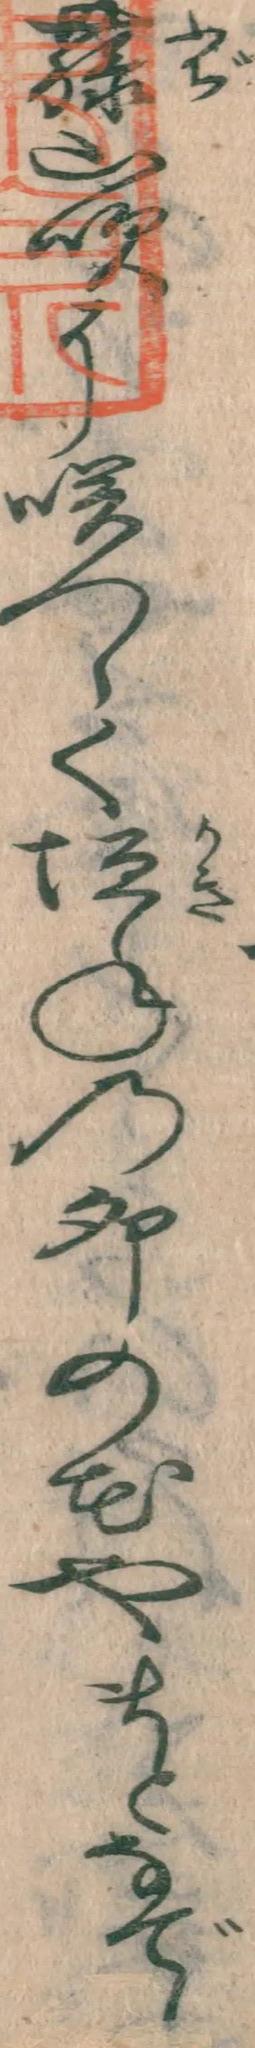藤山吹に咲つゝく垣ねの卯の花やまとなでし
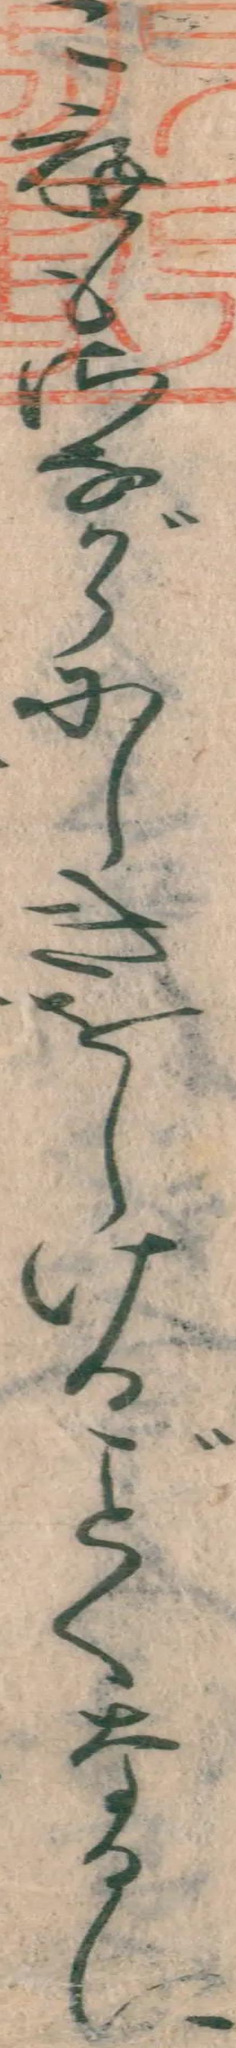こへもさながらにしきをしけるごとくなるに
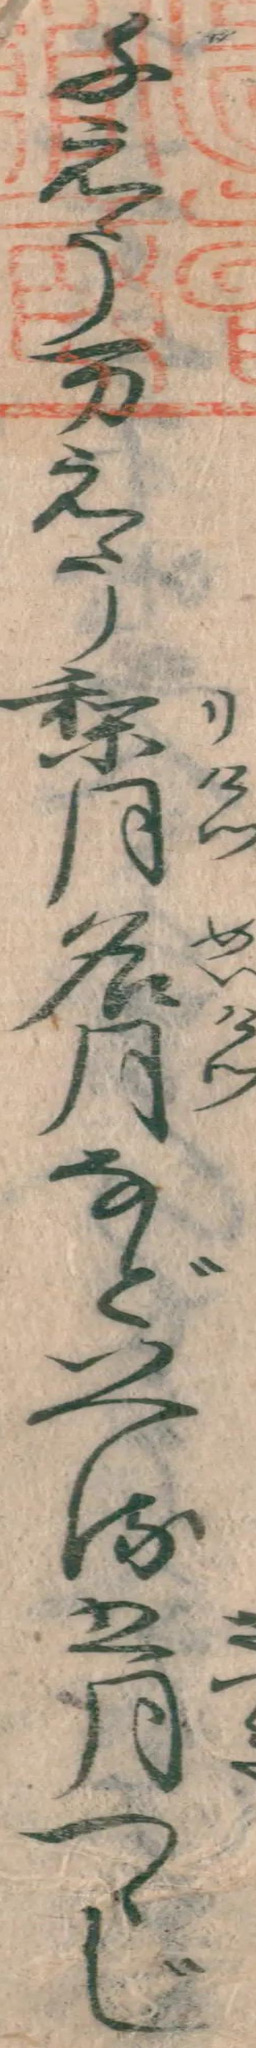千えう万えう梨月名月などいへる五月つゝじ
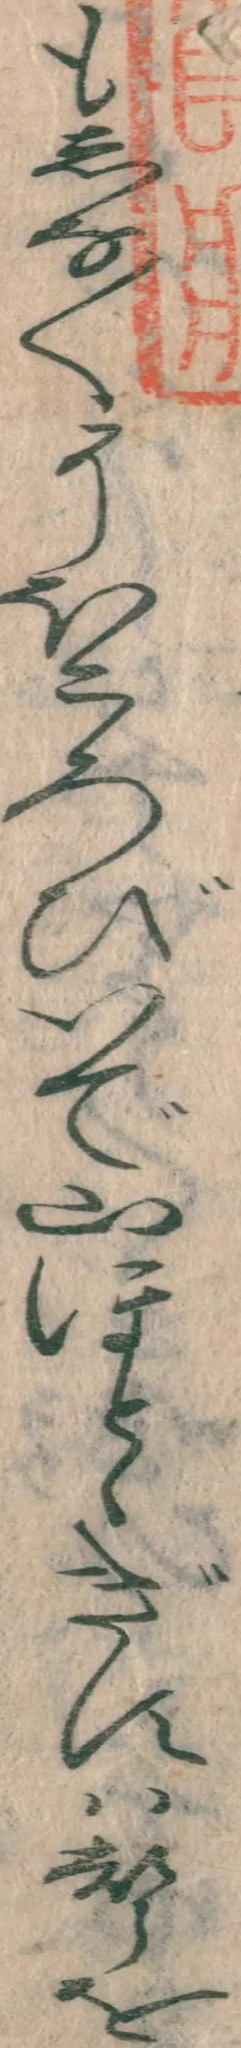もしな〳〵にほころびいで山ほとゝぎすは聲を
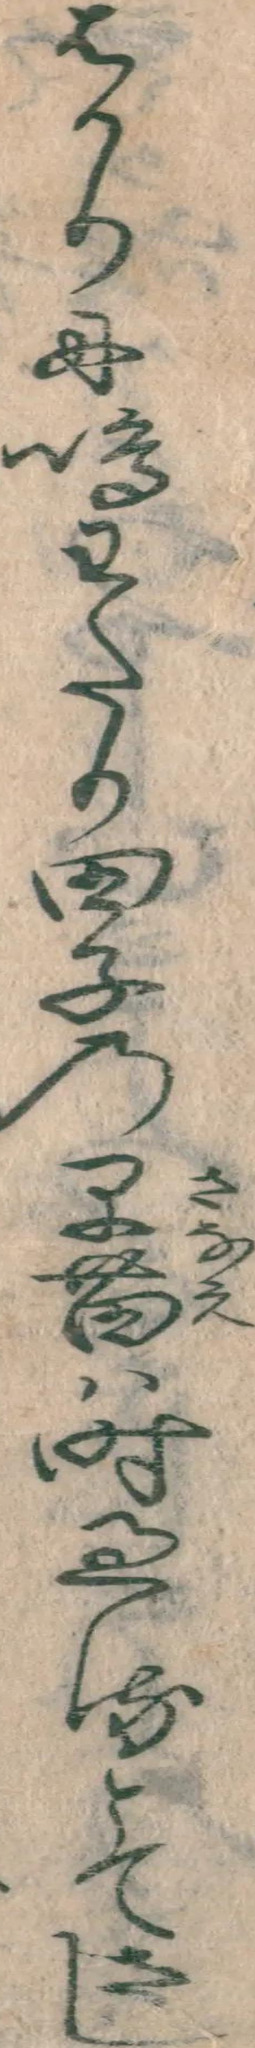はかりに鳴わたり田子の早苗は時過るとてさし
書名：艱難目異志. 上,下
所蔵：国立国会図書館 National Diet Library, JAPAN
